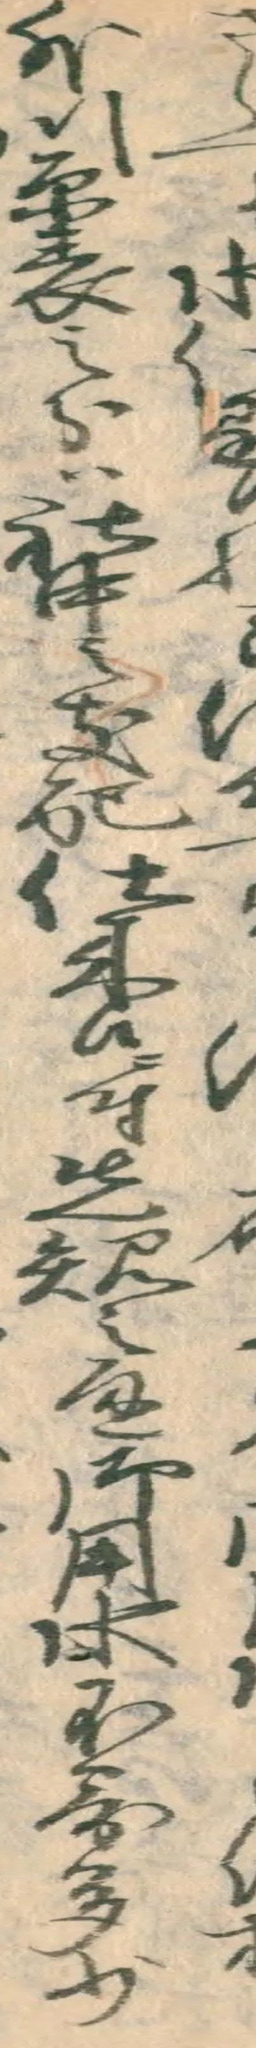外川原表之分ハ社中之支配仕来候ニ付先規之通御用水不寄多少
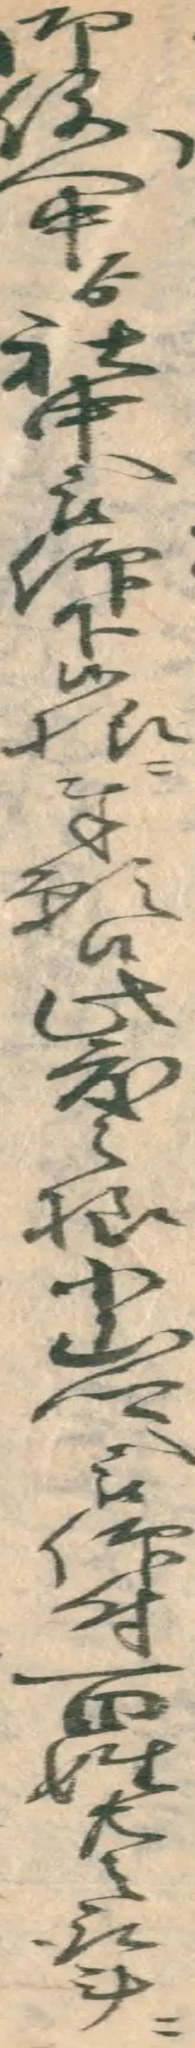御役人中ゟ社中へ被仰下候様ニ奉願候此度之様小山郷へ被仰付百姓共之取計ニ
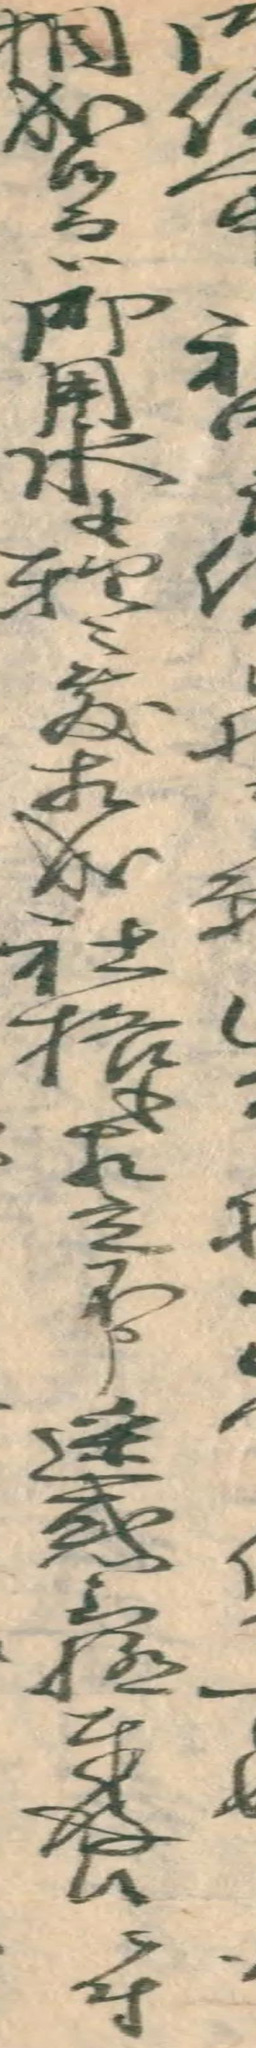相成候而ハ御用水も軽々敷相成社格も相立不申迷惑至極奉存候ニ付
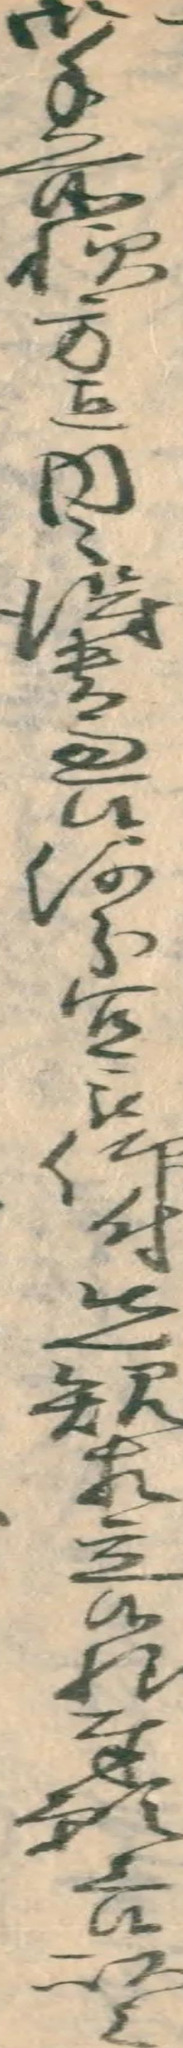御手前様方迄内々得貴慮候何分宜被仰付先規相立候様奉願上候以上
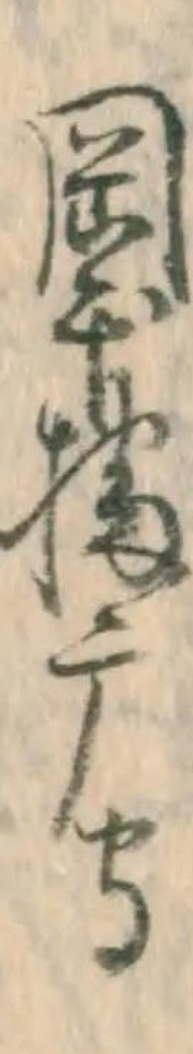岡田播磨守
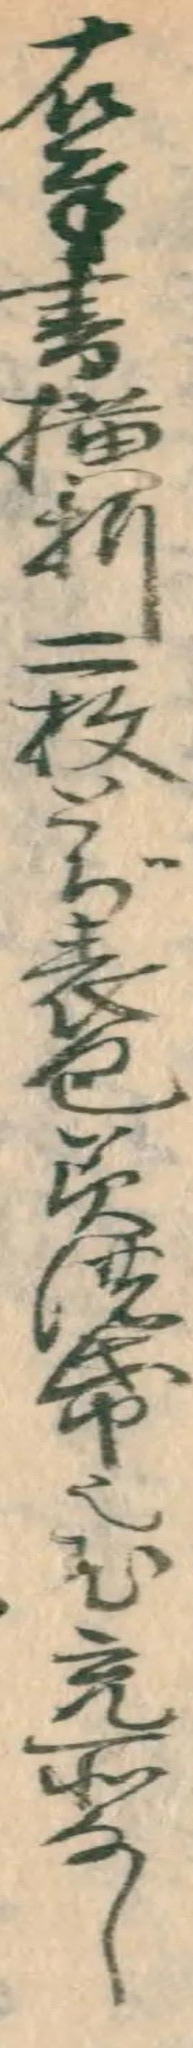右奉書横折二枚とぢ表包美濃紙也尤充所なし
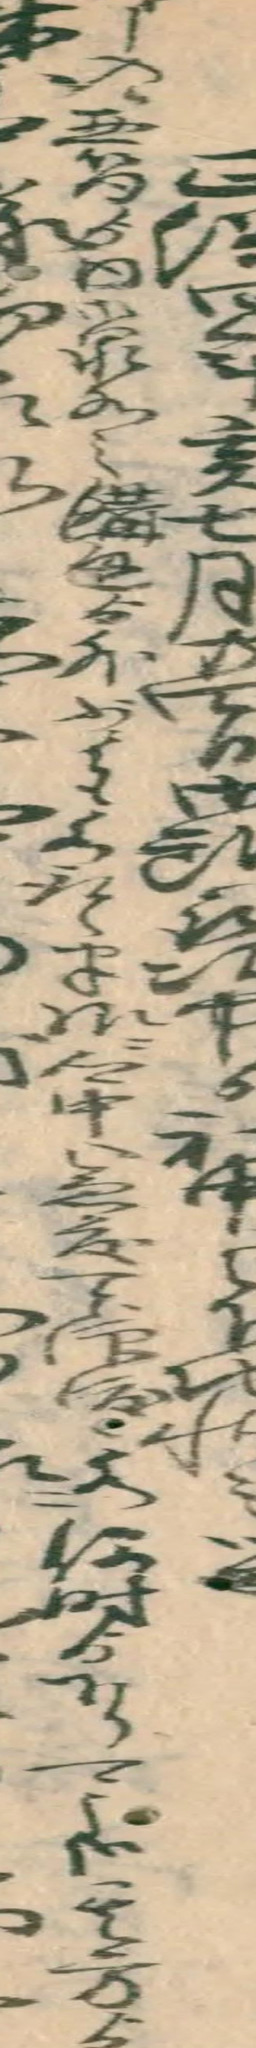猶申入候惣筒ゟ内御泉水之溝通ゟ外少々ニても水取候半様ニ郷中へ急度可被仰渡候水何時ゟ下り可申哉其方ゟ
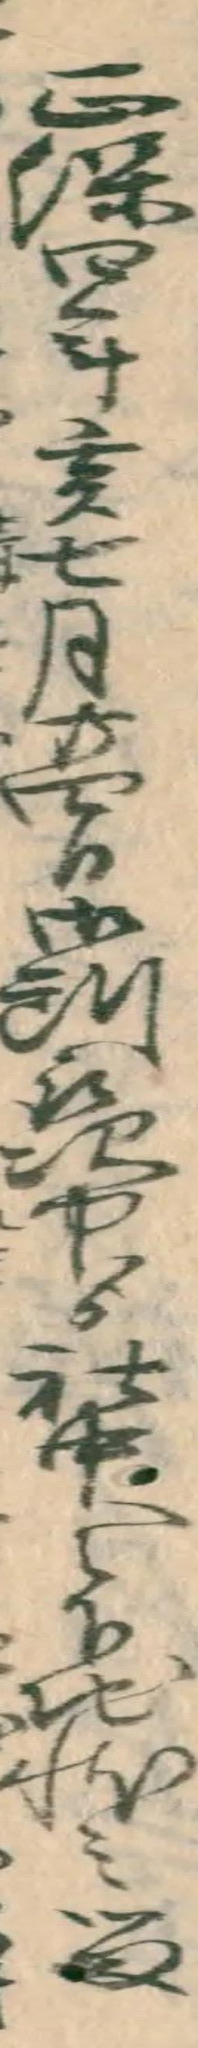正保四年亥七月廿四日御所取次中ゟ社中へ之下地状之留
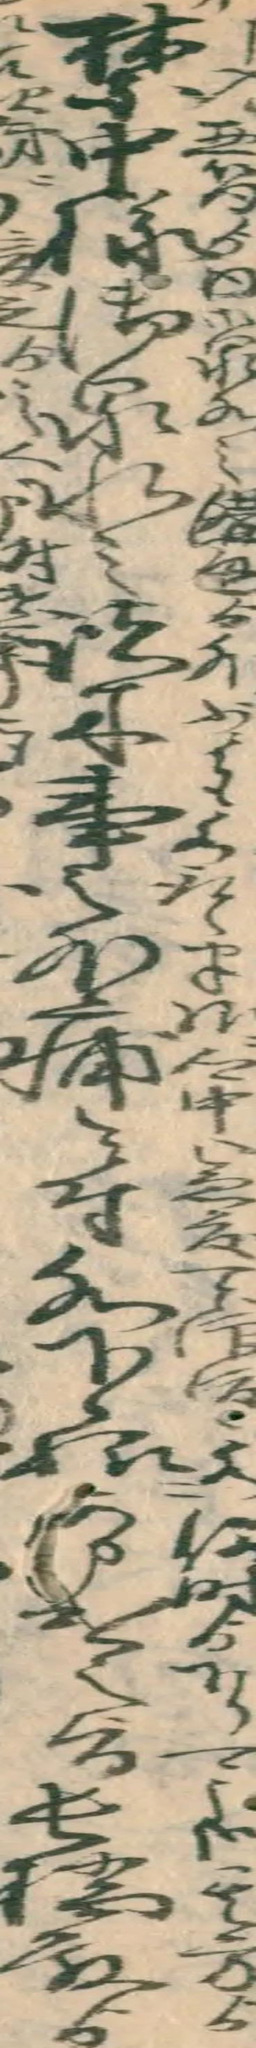禁中様御泉水之諸木事之外痛候ニ付水下候様ニ可申遣之旨長橋殿ゟ
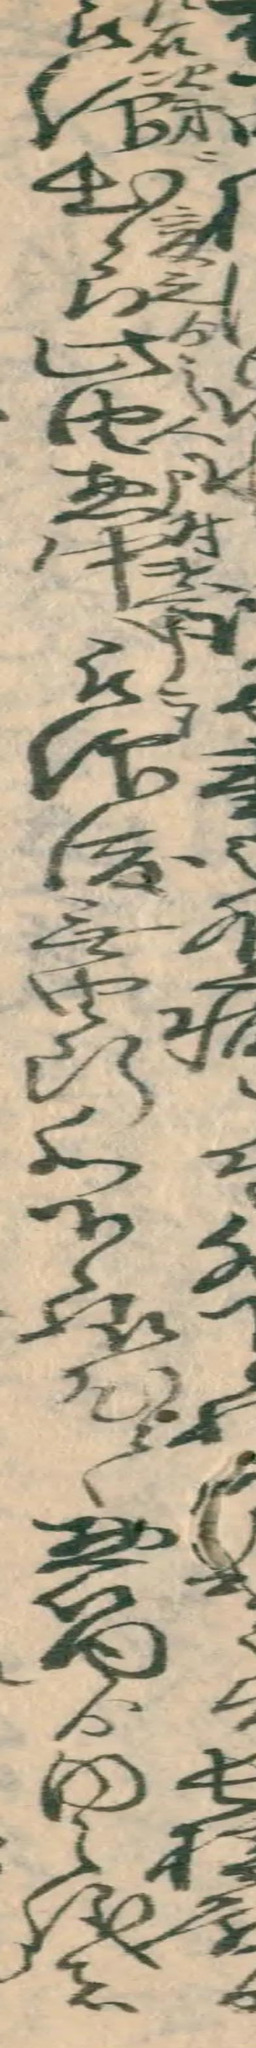被仰出候間此由惣中へ被仰渡無由断水下候様尤ニ候惣筒ゟ内之儀者
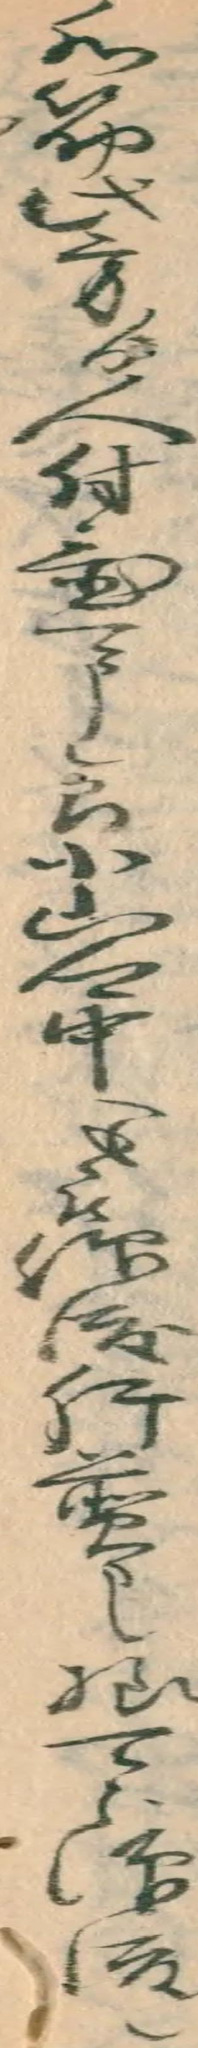水筋此方ゟ人付置可申候間小山郷中へも被仰渡肝煎申候様可被仰渡候
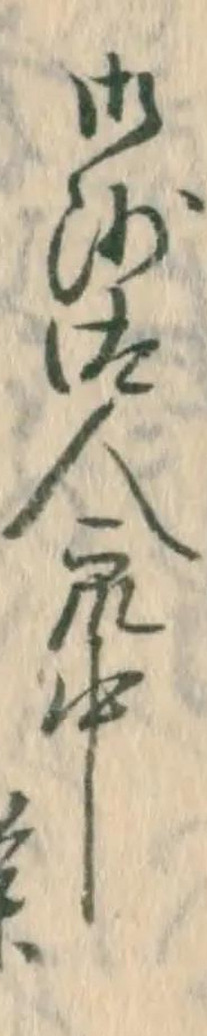御沙汰人衆中
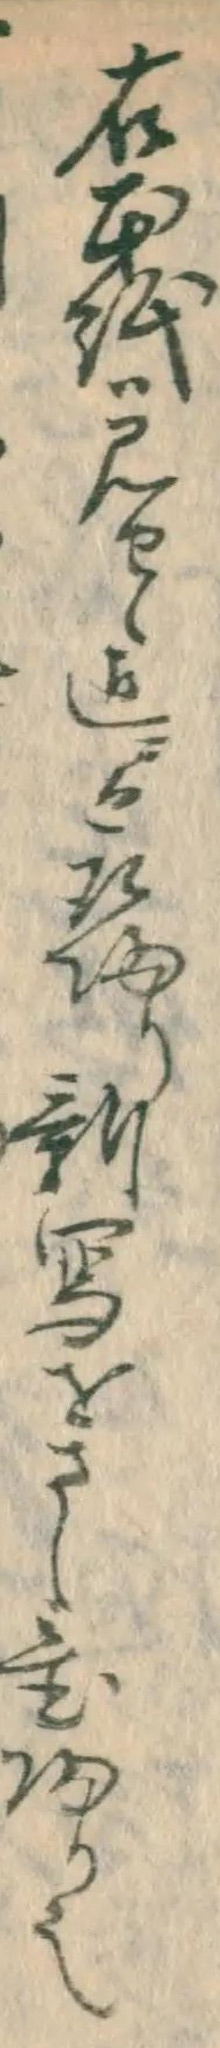右本紙ハ見セ候迄ニ而取帰り新写をさし置帰り也
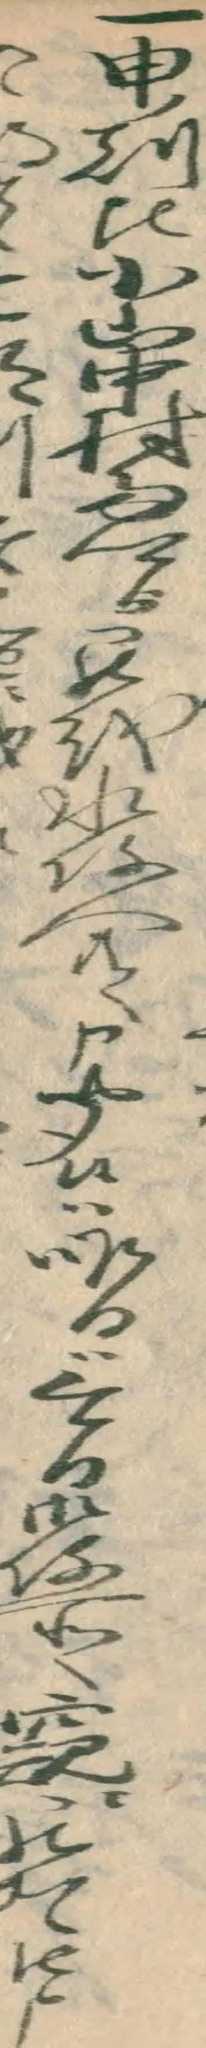一申ノ刻比小山中村両郷ゟ罷越水役人共へ申聞候ハ昨日ハ今日御役所へ窺ニ罷出候由申
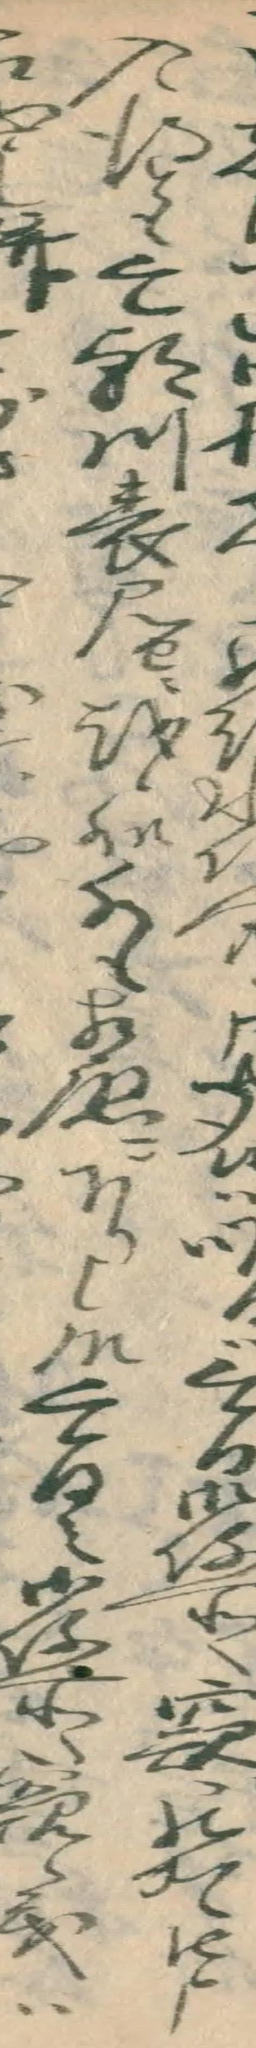入候得とも今朝川表見セニ越候処水も相応ニ下り申候故今日之御役所へ窺候義ハ
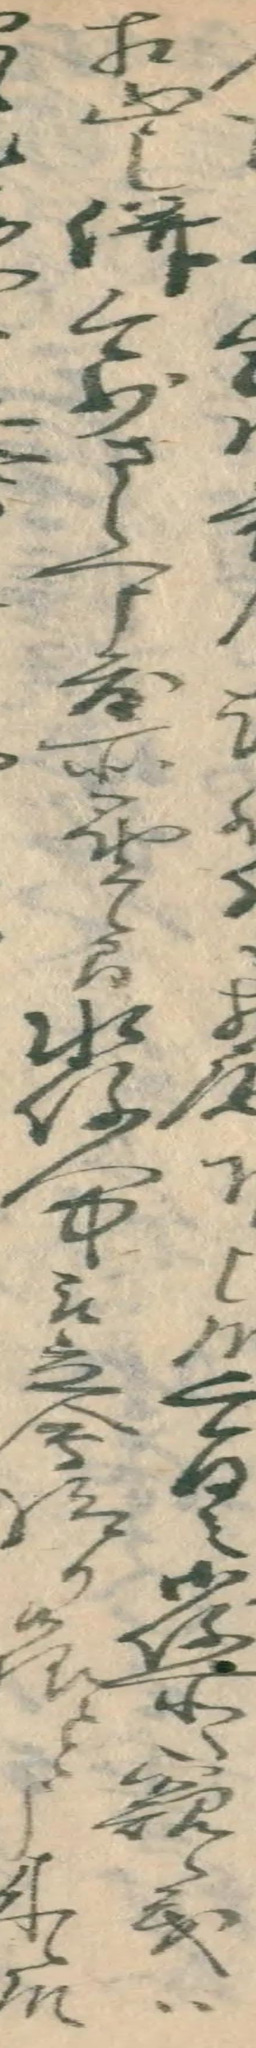相止申候併今少さらへ申度所御座候間水役人中被立会給り候様ニと申来候故
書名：賀茂社記録. 第58冊
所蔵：国立国会図書館 National Diet Library, JAPAN
